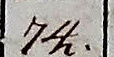74.
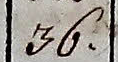36.
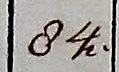84
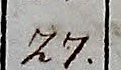27.
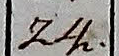24
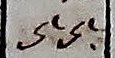55.
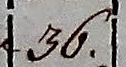36.
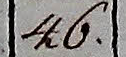46.
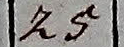25
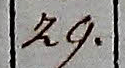29.
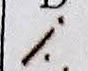1.
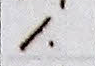1.
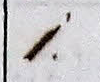1.
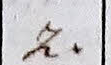2.
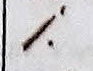1.
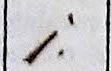1.
